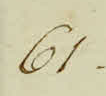61
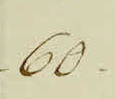60
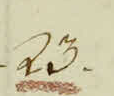23
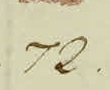72
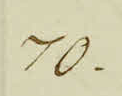70
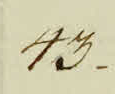43
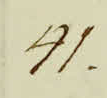41
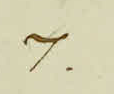7.
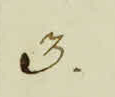3.
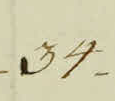34
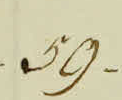59
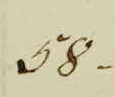58
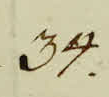34
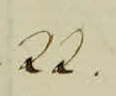22
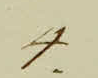4.
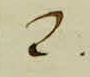2
